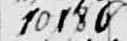10186
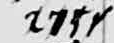2757
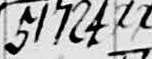51724
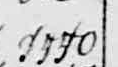3550
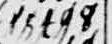15498
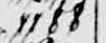1188
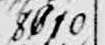8610
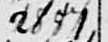2897
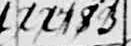22783
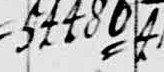54486
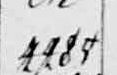4485
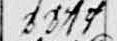3375
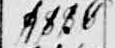9886
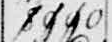8990
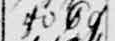5069
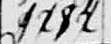9254
